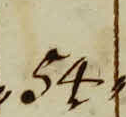54
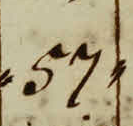57
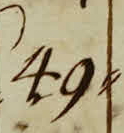49
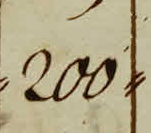200
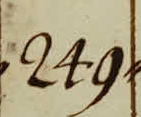240
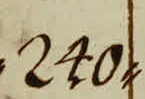240
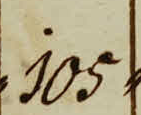105
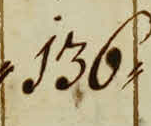136
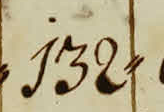132
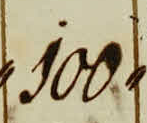100
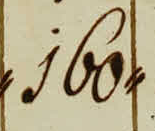160
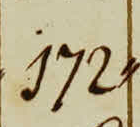172
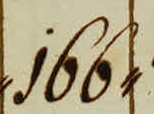166
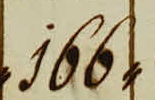166
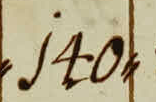140
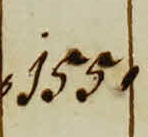155
